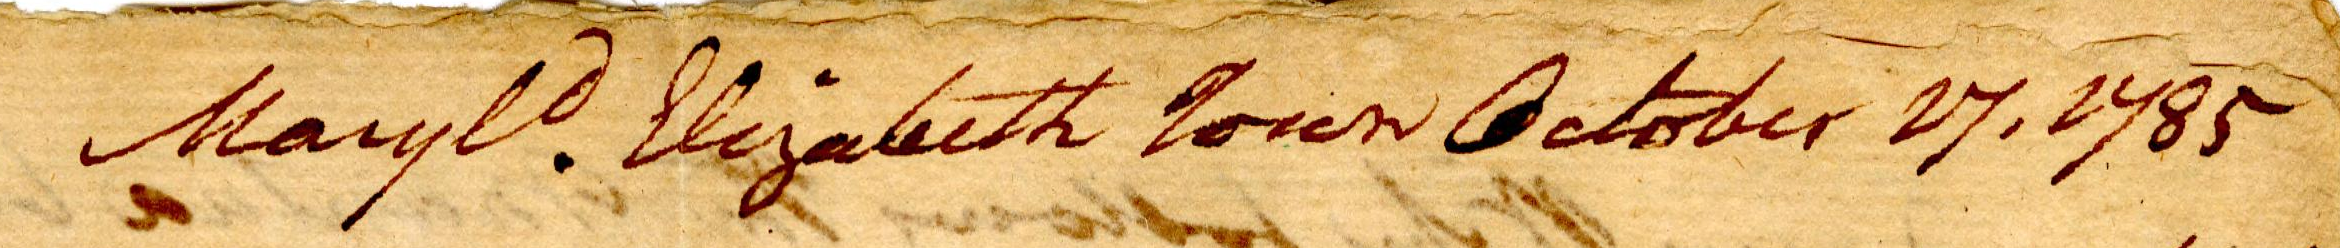Maryl^d. Elizabeth Town October 27. 1785
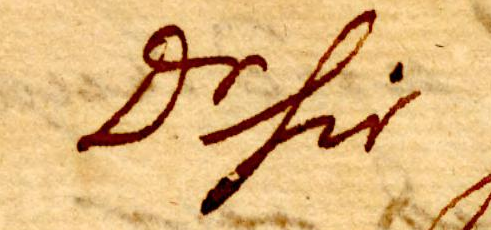D^r Sir
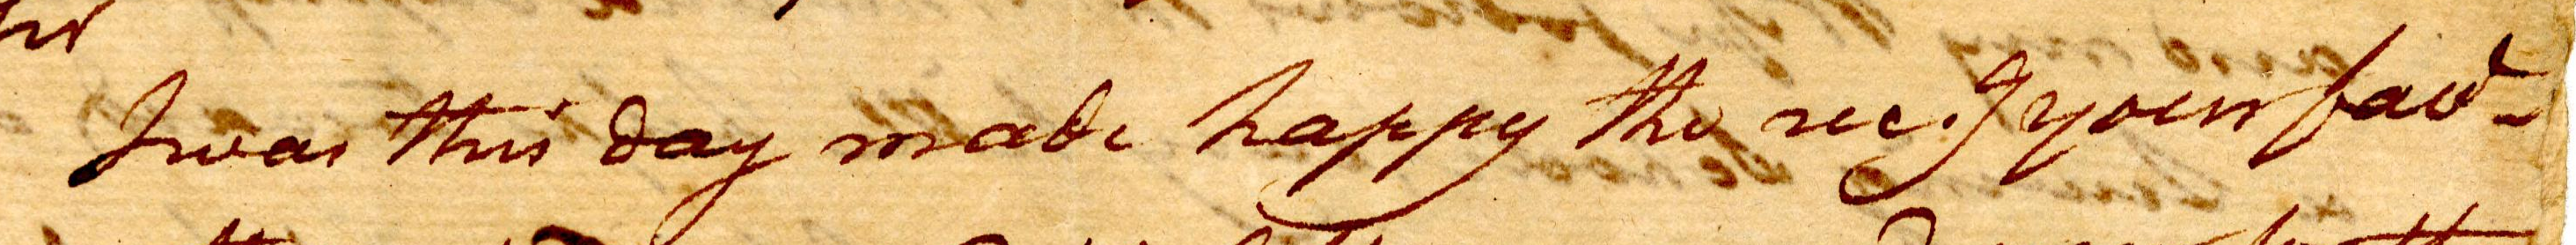I was this day made happy the rec^g your fav^r
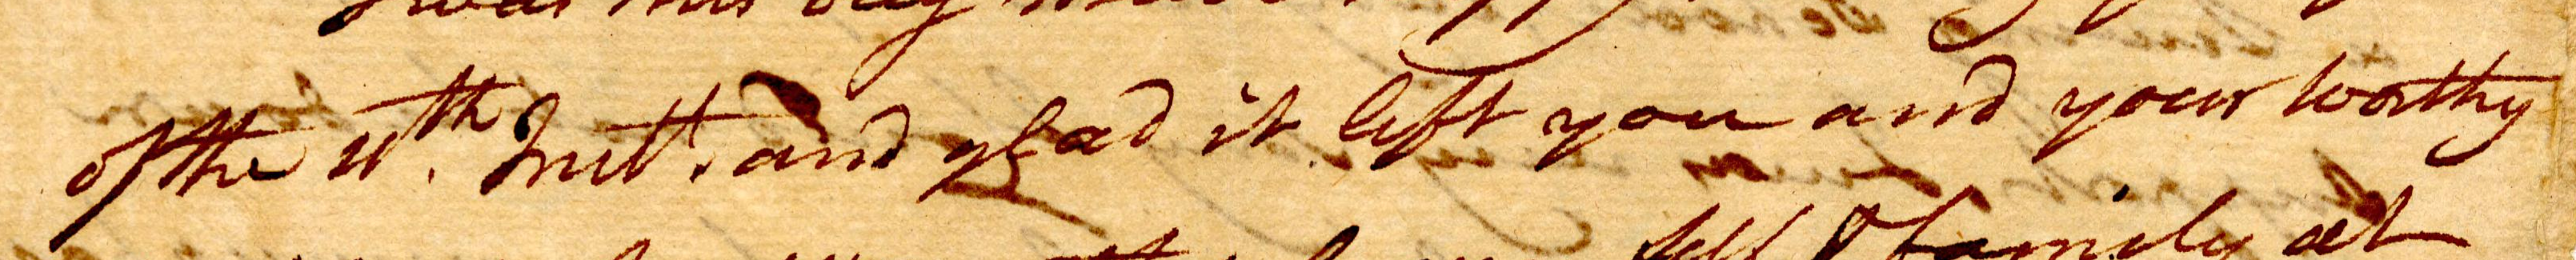of the 11^th Inst^t. and glad it left you and your worthy
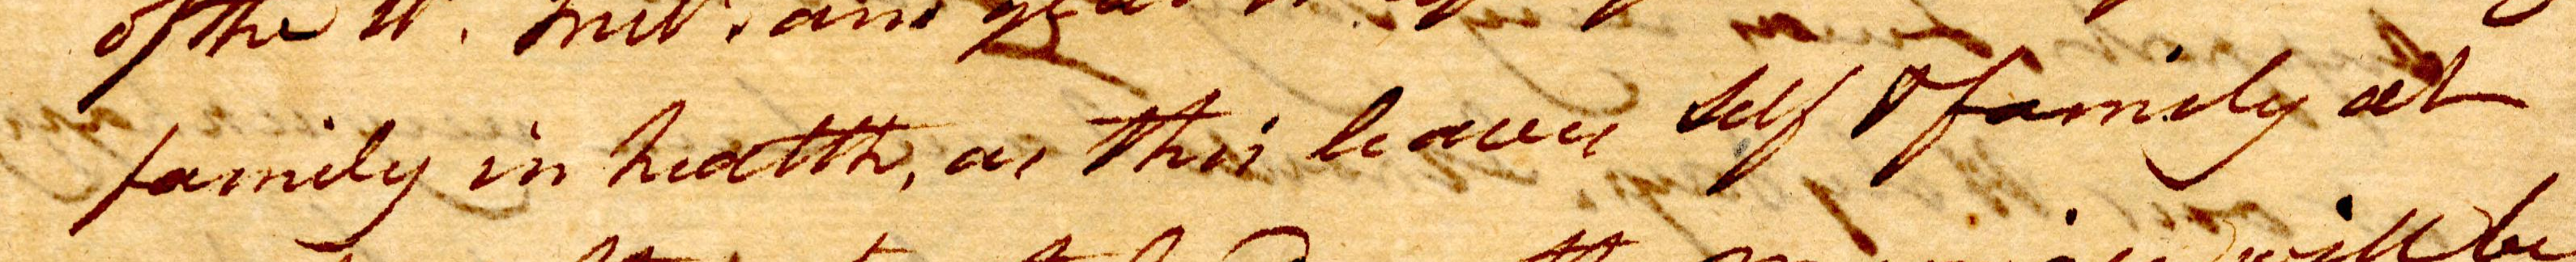family in health, as this leaves self & family at
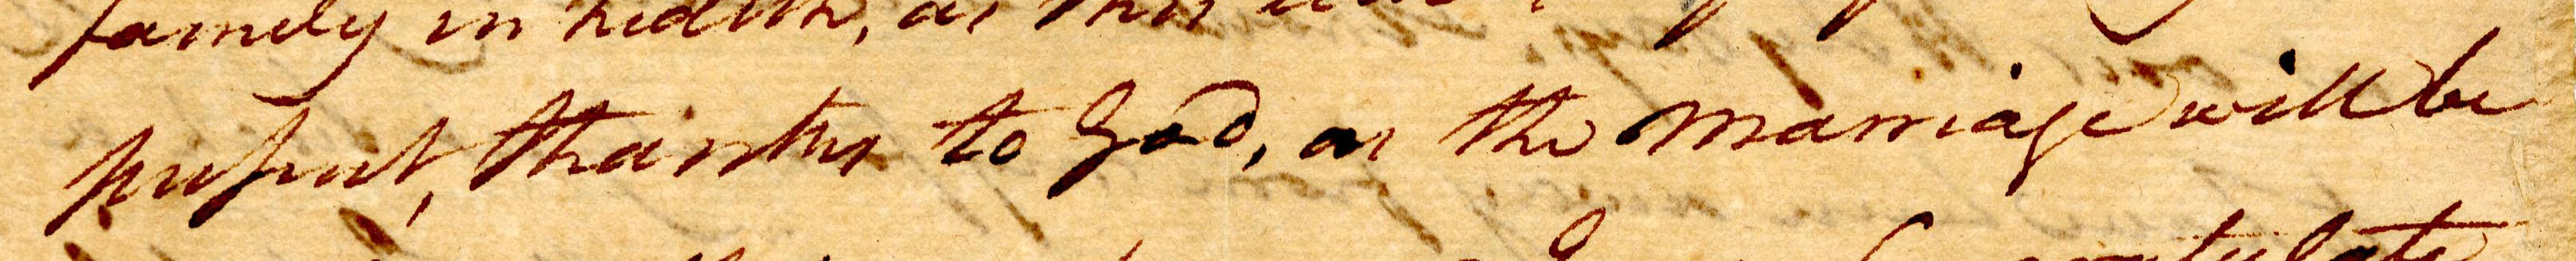present, thanks to God, as the Marriage will be
